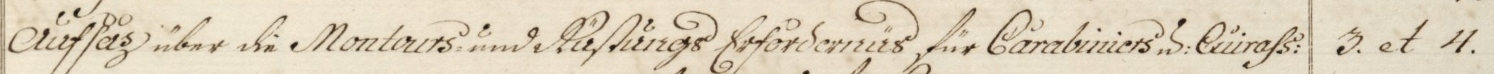Aufsaz über die Montours- und Rüstungs Erfordernüs für Carabinier u. Cuirass. 3. et 4.
